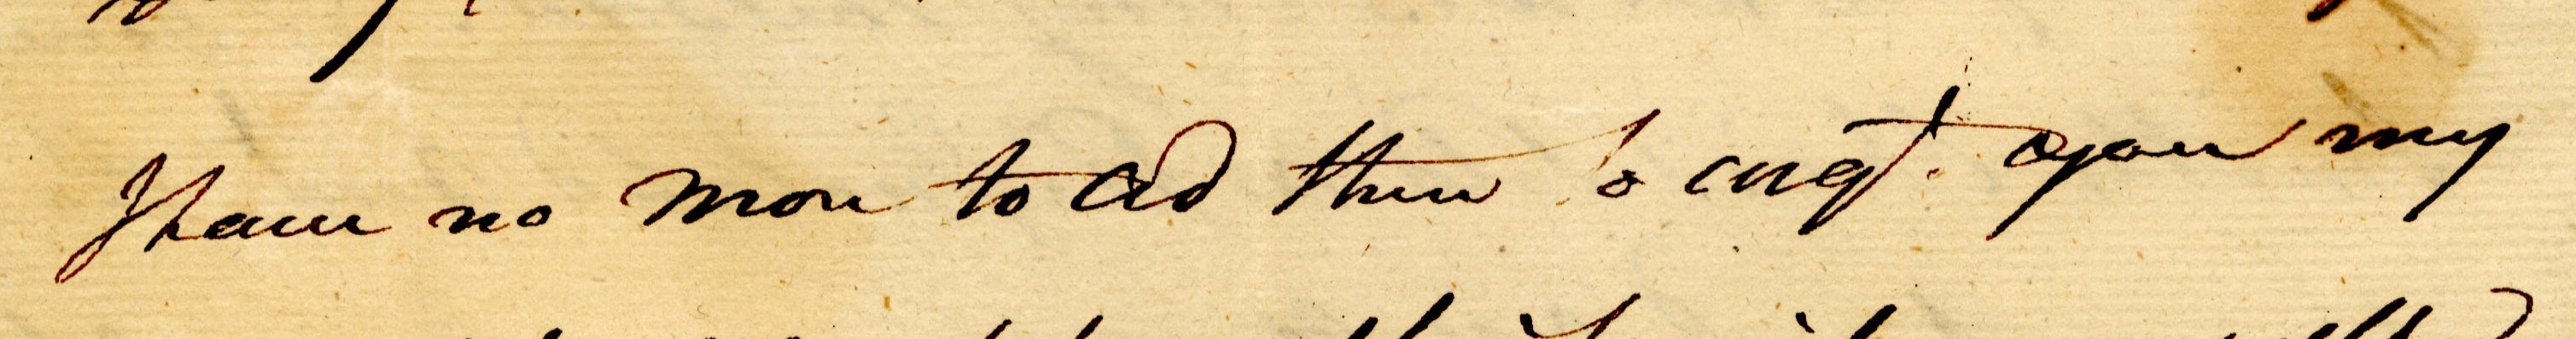I have no more to Ad then so acq^t you my
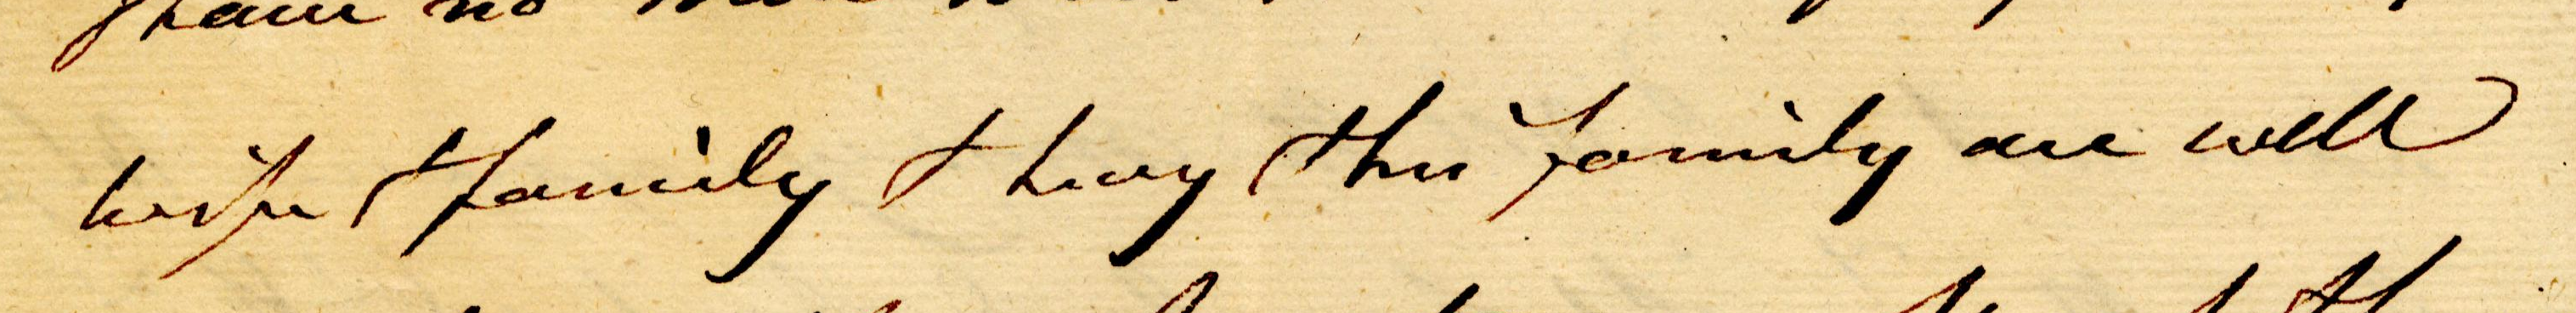wife & family & say the family are well
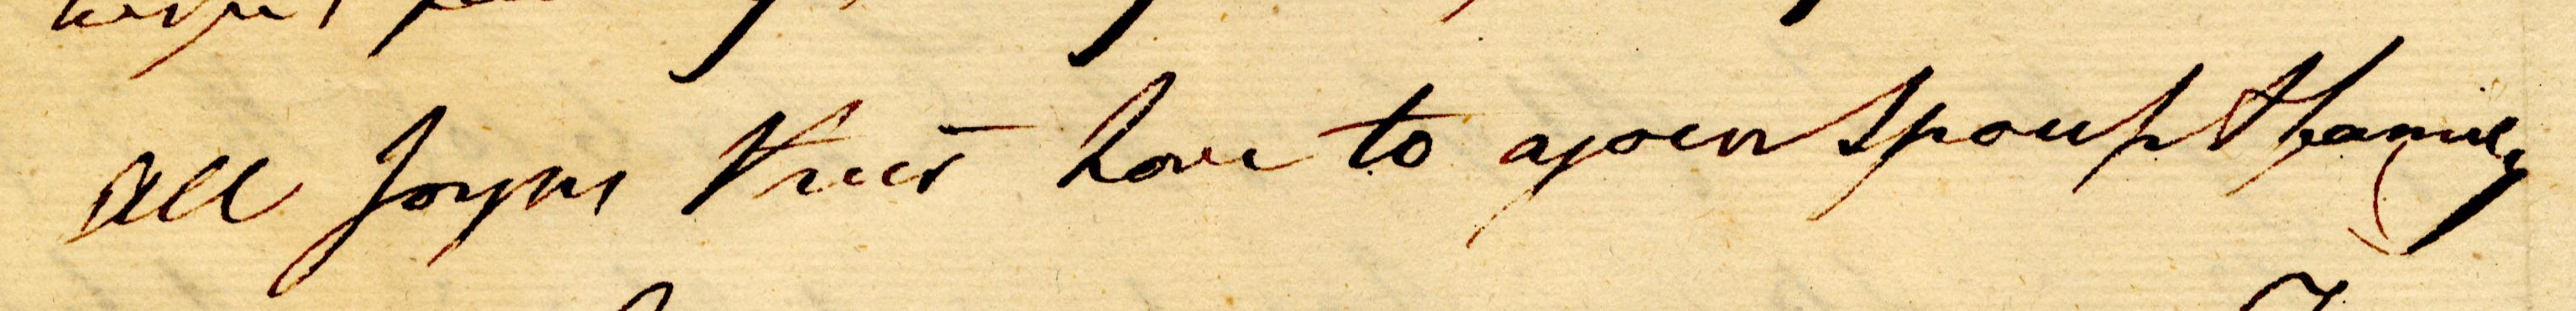all Joyns their love to your spouse & family
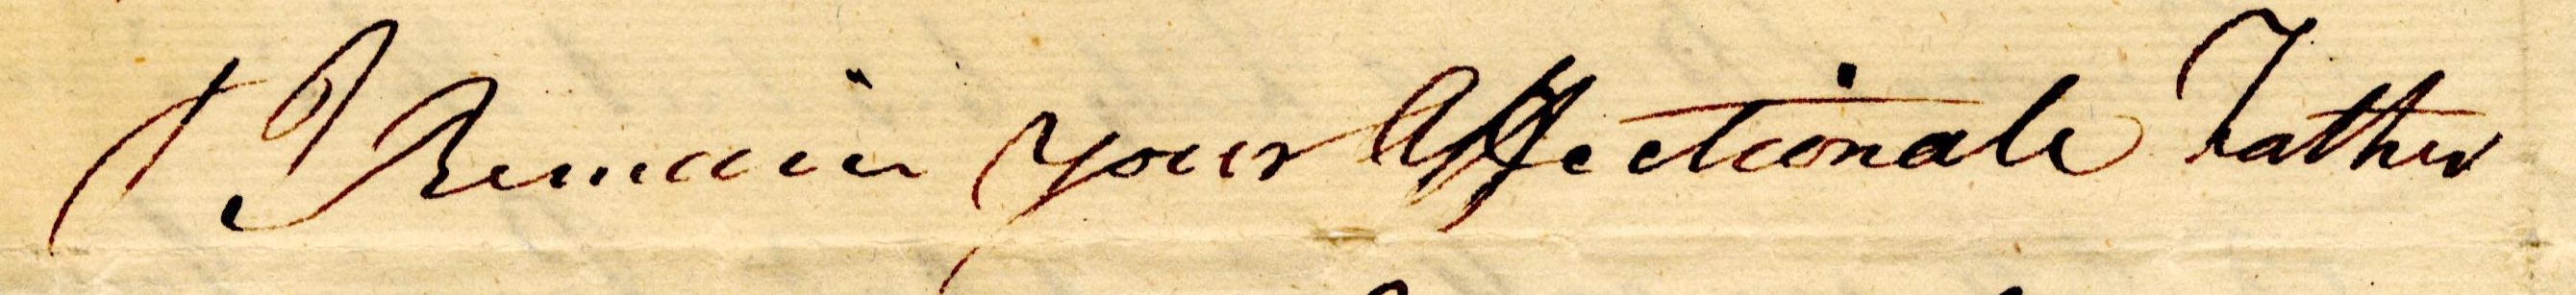& I remain your Affectionate Father
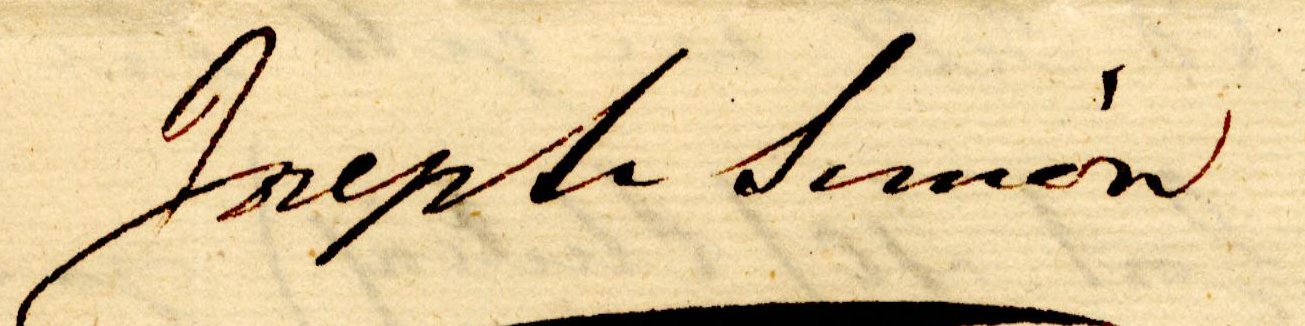Joseph Simon
